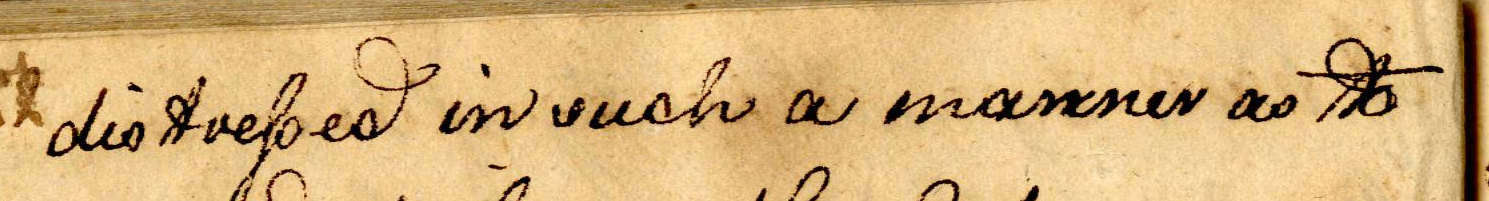distressed in such a manner as to
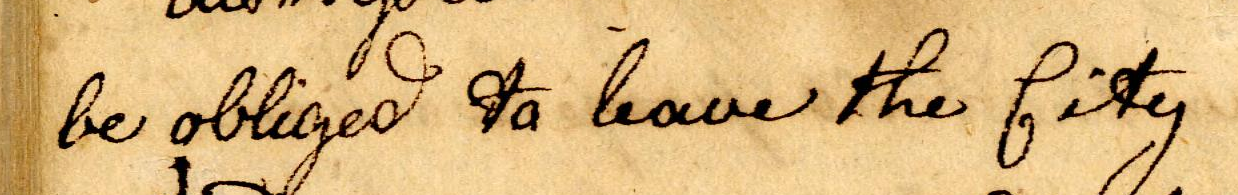be obliged to leave the City
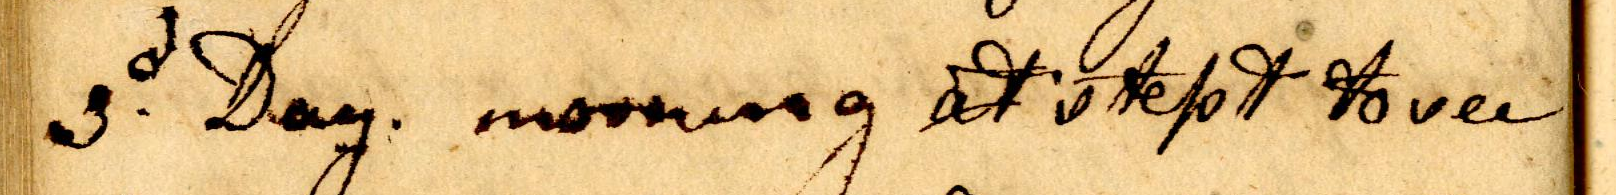3^d. Day. morning [at] stept to see
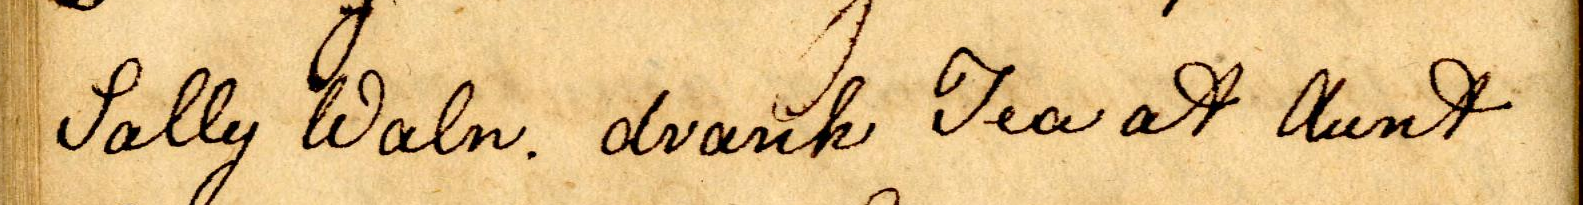Sally Waln. drank Tea at Aunt
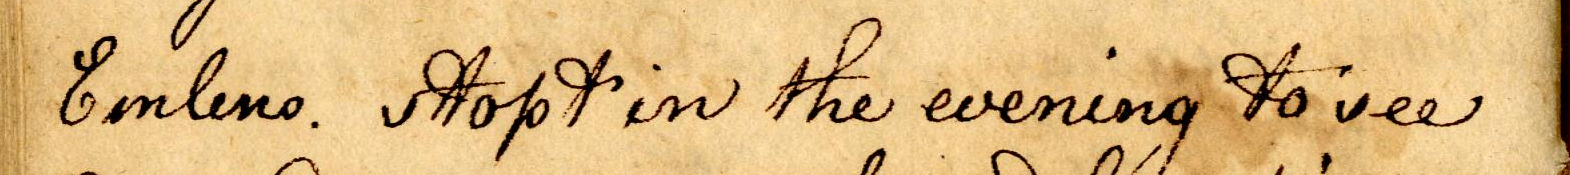Emlans. stopt in the evening to see
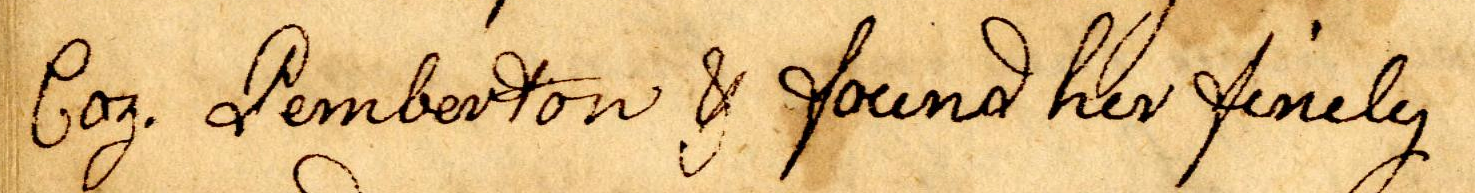Coz. Pemberton & found his finely
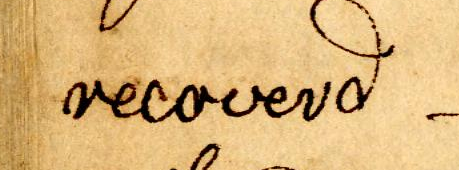recoverd-
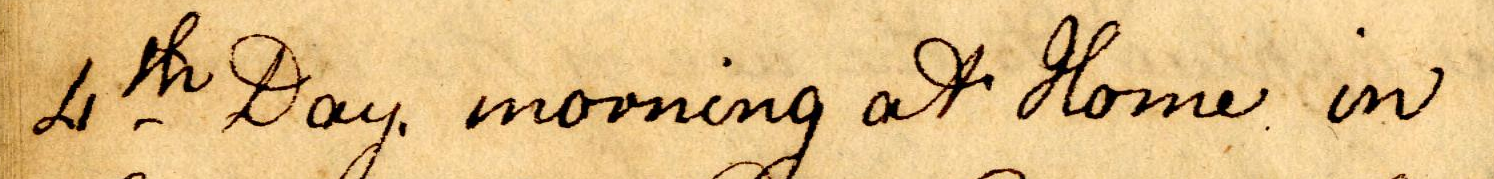4^th Day. morning at Home in
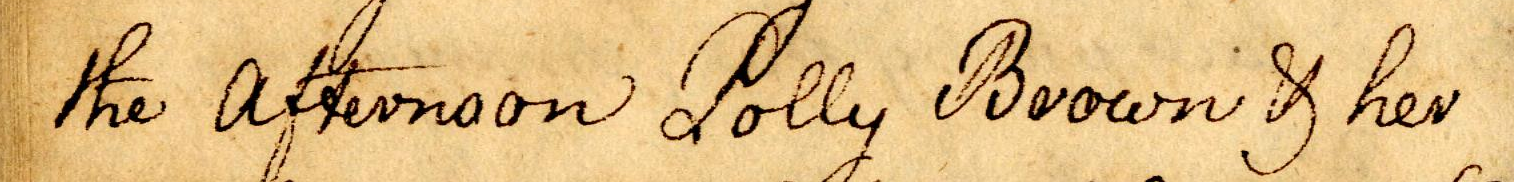the Afternoon Polly Brown & her
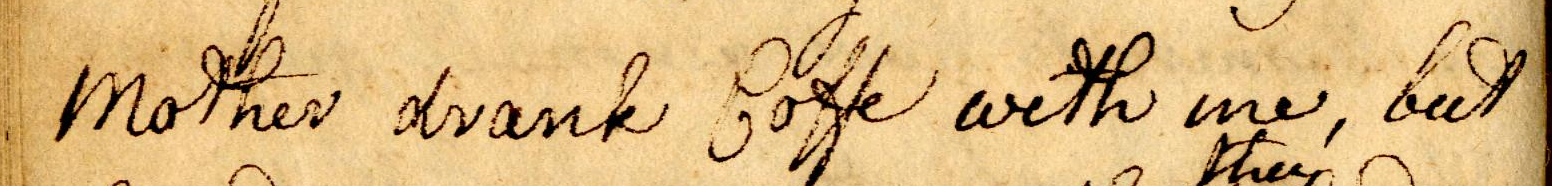Mother drank Coffe with me, but
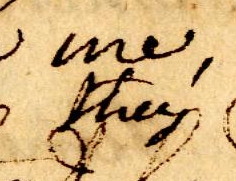they
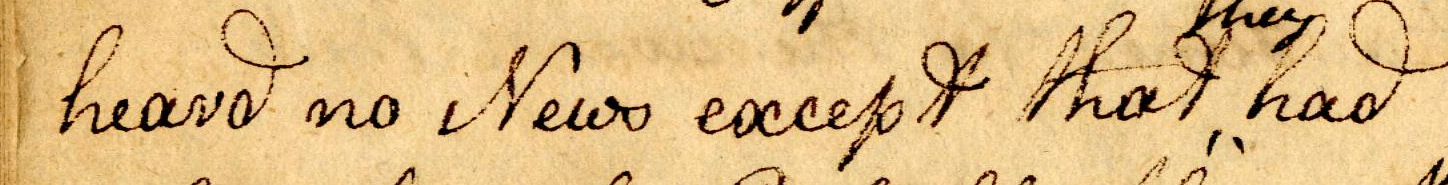heard no News except that ^ had
